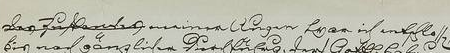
des Zustandes meiner Augen war ich entschlossen,
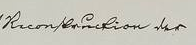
Reconstruction der
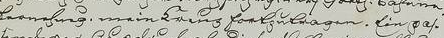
ternehmg. mein Kreuz fortzutragen . Ein pas-
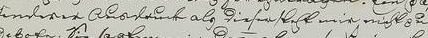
senderer Ausdruck als dieser steht mir nicht zu
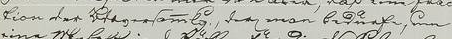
tion der Bdsversammlg., deren man bedürfe, um
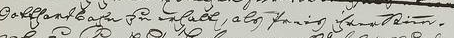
Gotthardbahn zu erhalten, als Preis ihrer Stimm-
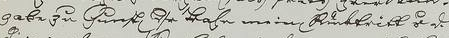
gabe zu Gunsten dsr Bahn meinen Rücktritt aus d.
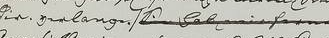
Dir. verlange. |Sie haben im Fernern
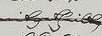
mitgeteilt,
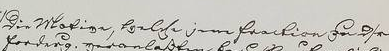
Die Motive, welche jene Fraction zu dsr
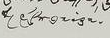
Angesichts einer so
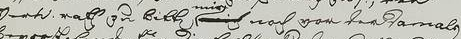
Verw.rath zu bitten, michmir noch vor der damals
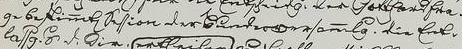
ge bestimmten Session der Bundesversammlg. die Ent-
